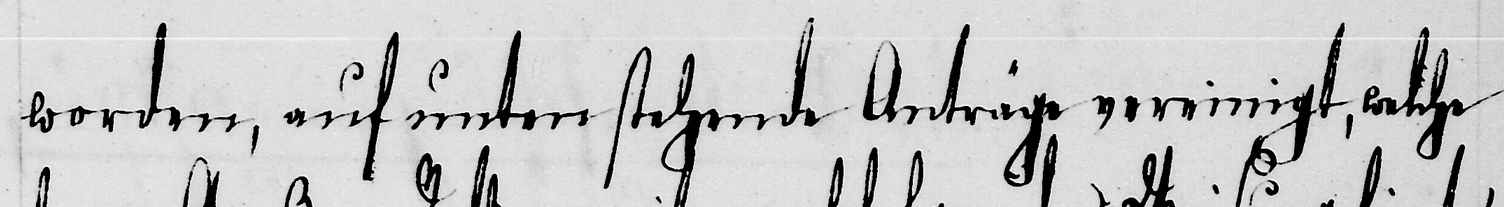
worden, auf unten stehende Anträge vereinigt, welche
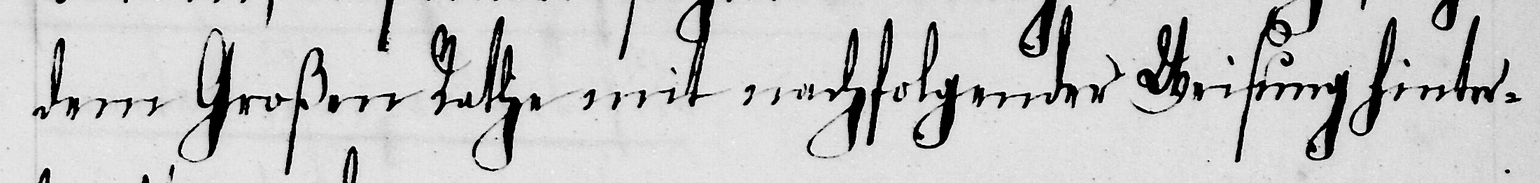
dem Großen Rathe mit nachfolgender Weisung hinter¬
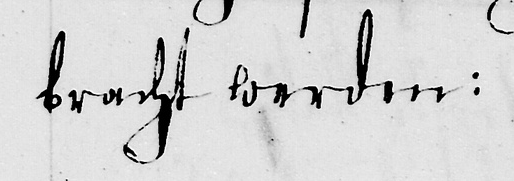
bracht werden:
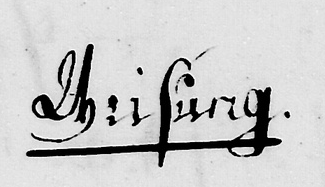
Weisung.
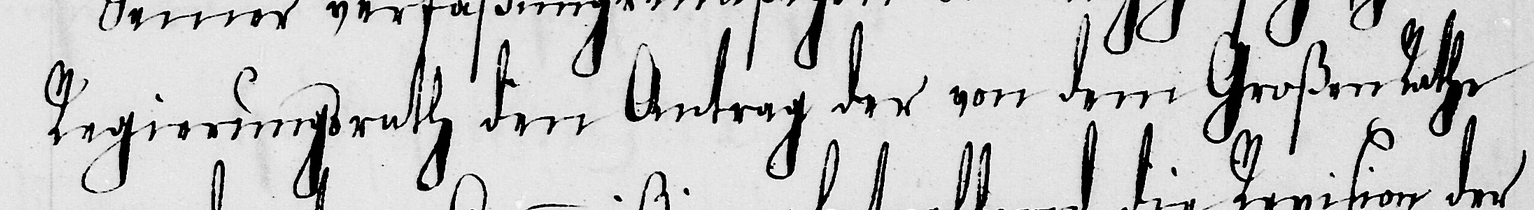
Regierungsrath den Antrag der von dem Großen Rathe
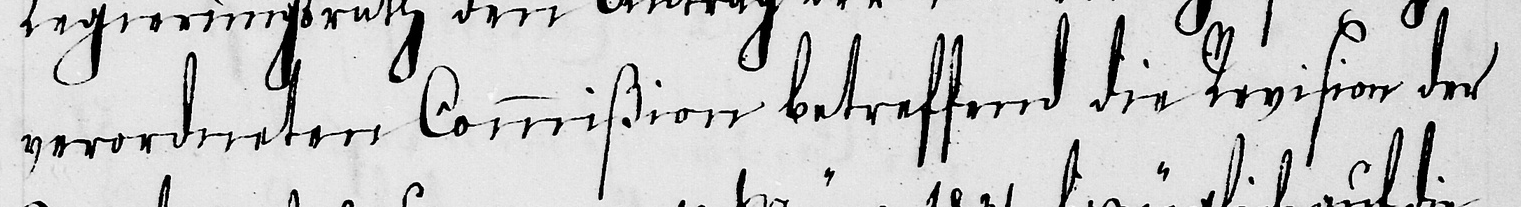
verordneten Commißion betreffend die Revision der
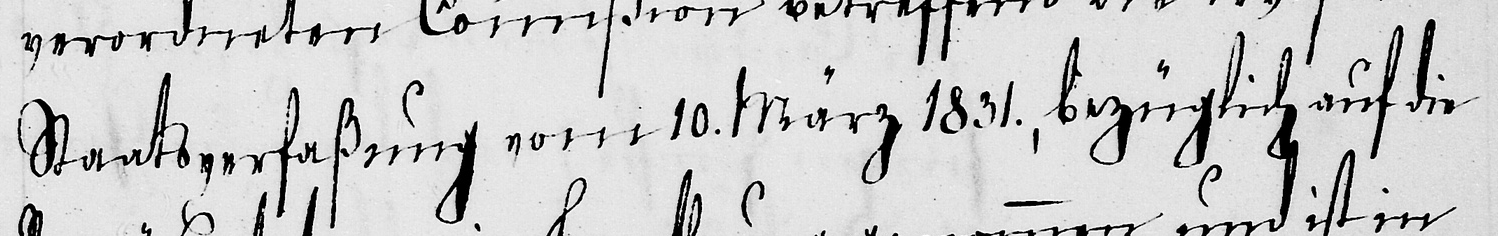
Staatsverfaßung vom 10. März 1831., bezüglich auf die
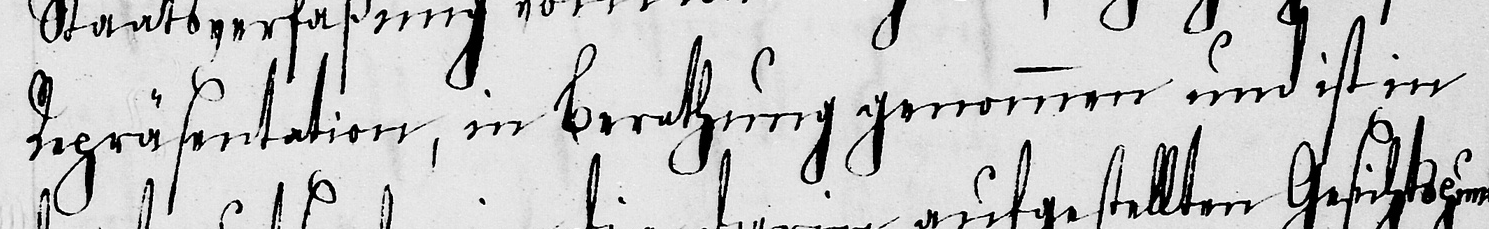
Repräsentation, in Berathung genommen und ist in
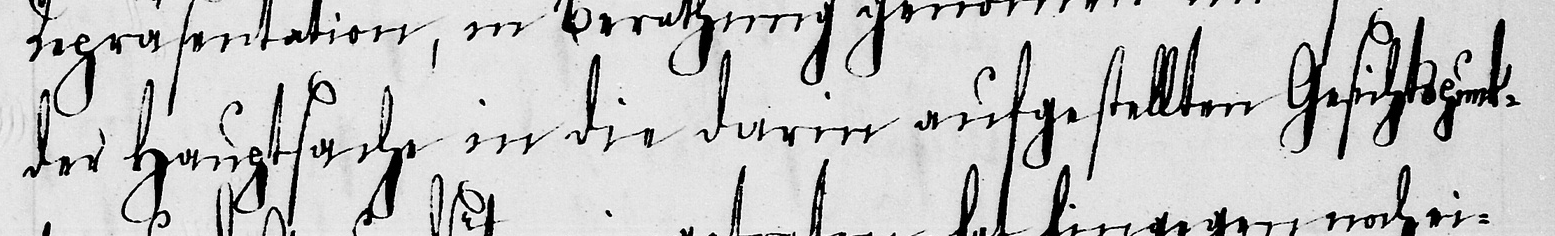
der Hauptsache in die darin aufgestellten Gesichtspu¬
